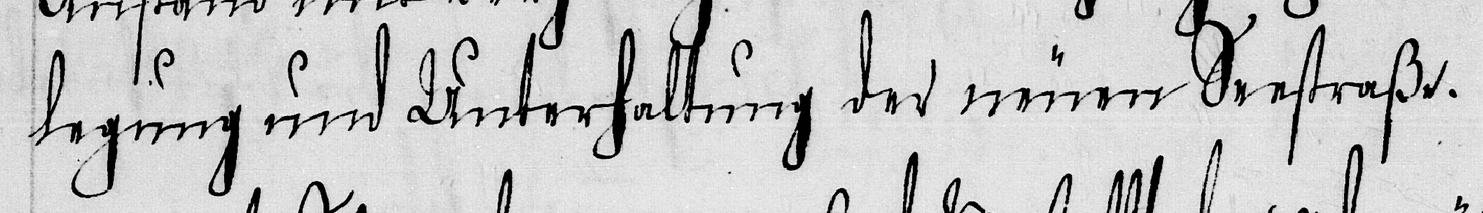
legung und Unterhaltung der neuen Seestraße.
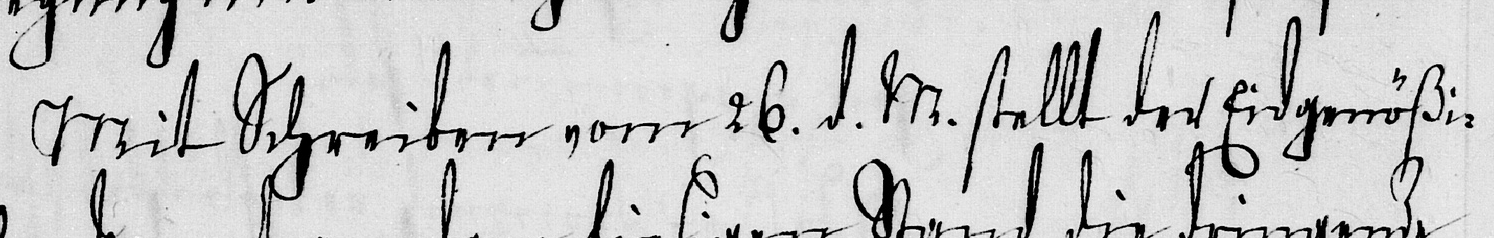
Mit Schreiben vom 26. d. M. stellt der Eidgenößi¬
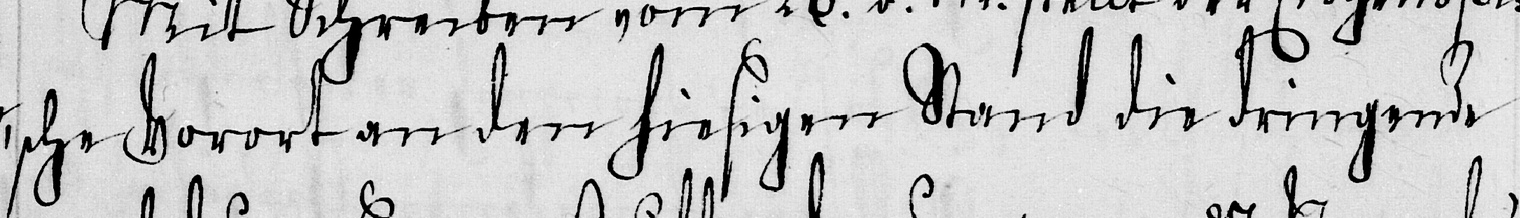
sche Vorort an den hiesigen Stand die dringende
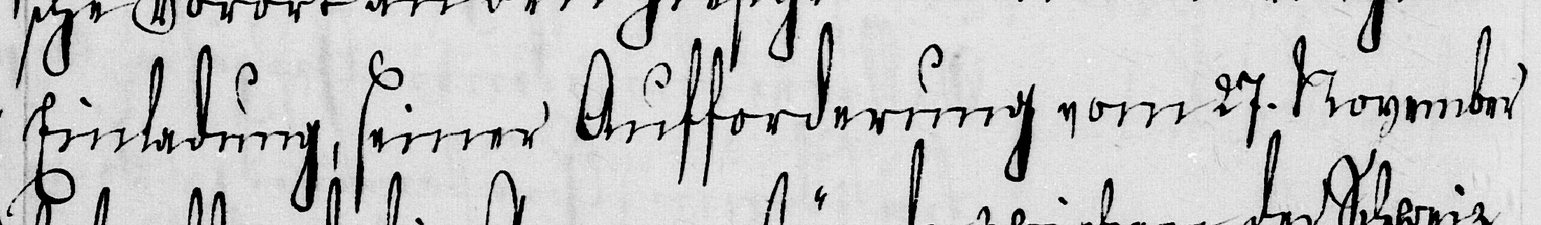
Einladung, seiner Aufforderung vom 27. November
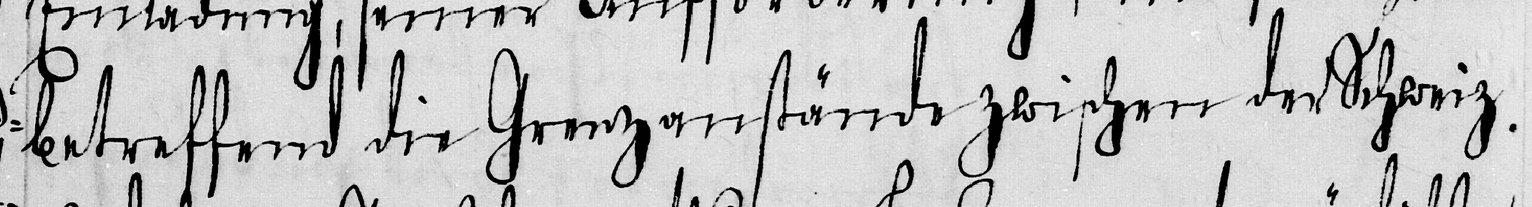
betreffend die Grenzanstände zwischen der Schweiz
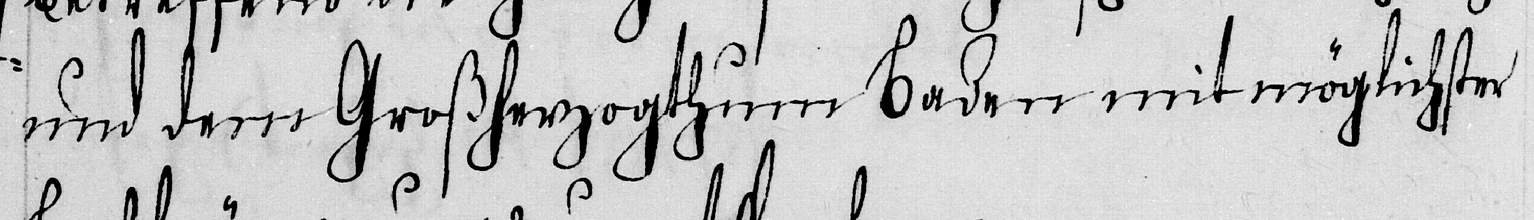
und dem Großherzogthum Baden mit möglichster
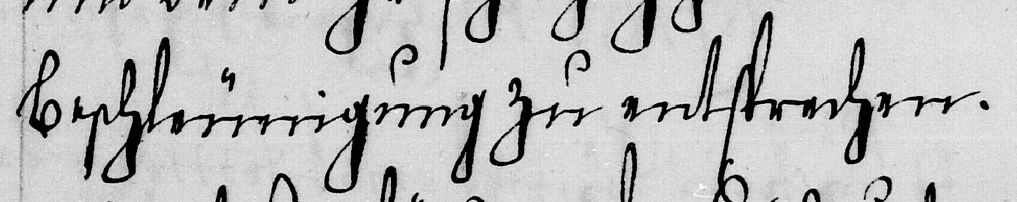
Beschleunigung zu entsprechen.
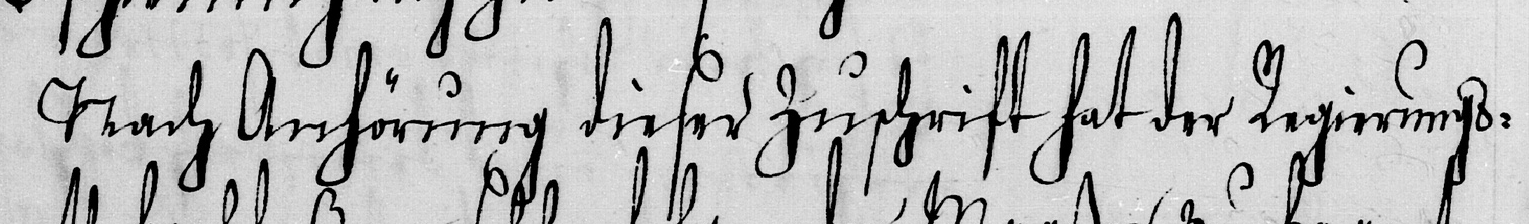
Nach Anhörung dieser Zuschrift hat der Regierung¬
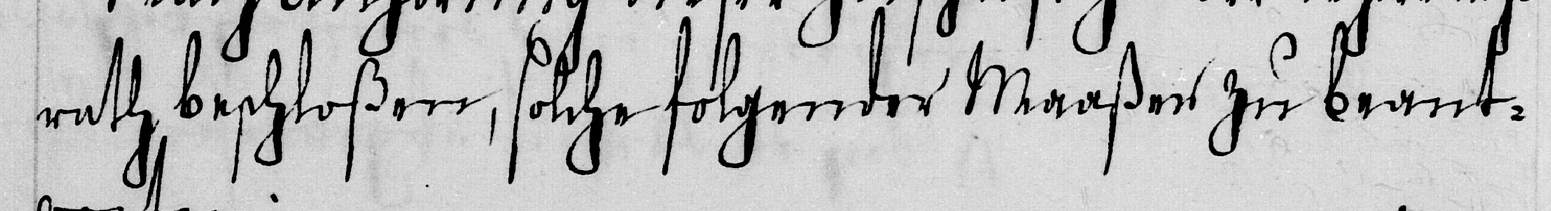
srath beschloßen, solche folgender Maaßen zu beant¬
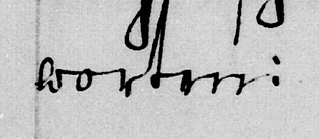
worten:
